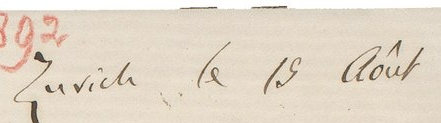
Zurich le 19 Août
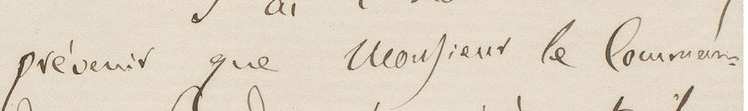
prévenir que Monsieur le Comman-
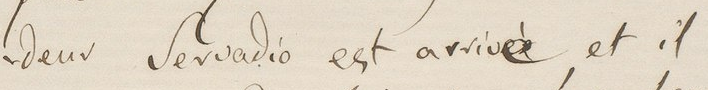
deur Servadio est arrivé, et il
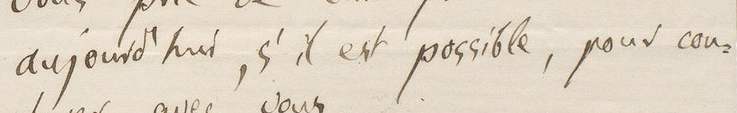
aujourd'hui, s'il est possible, pour con-
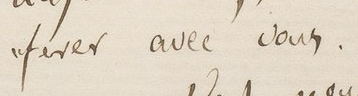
ferer avec vous.
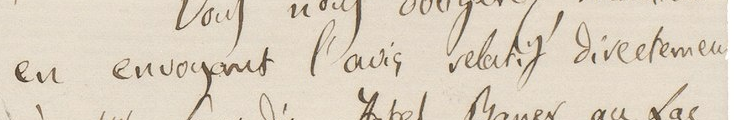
en envoyant l'avis relatif directement
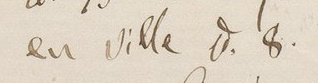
en Ville no 8.
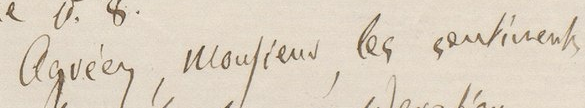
Agréez, Monsieur, les sentiments
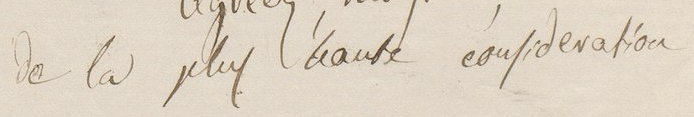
de la plus haute consideration
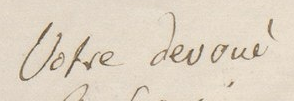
Votre devoué
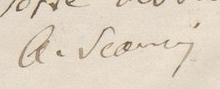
G. Scanzi
